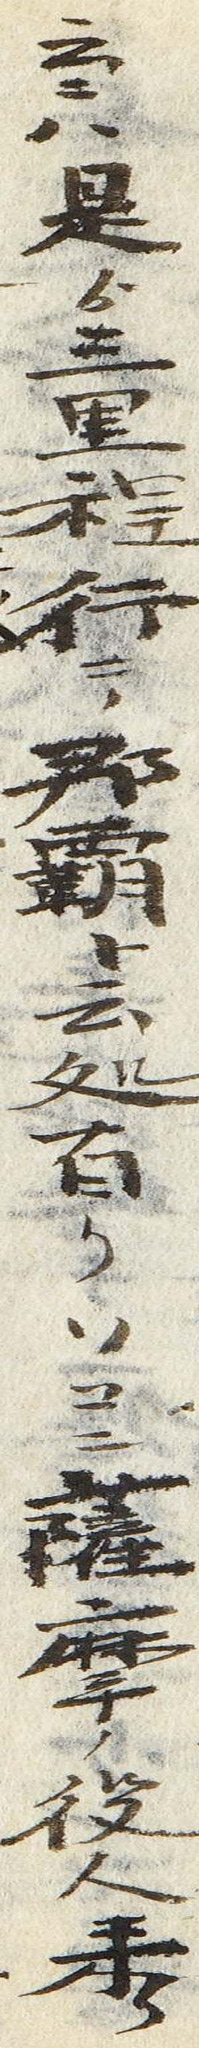云ニハ是ゟ三里程行テ那覇ト云処有リソコニ薩摩ノ役人来リ
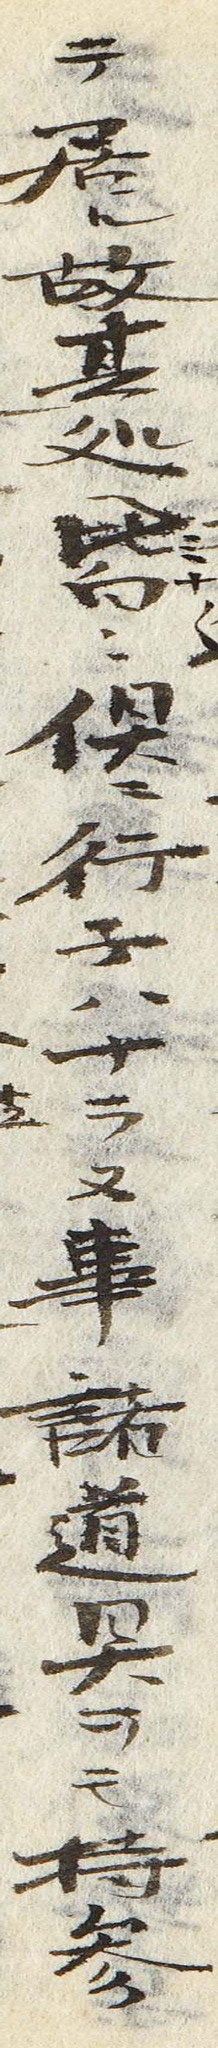テ居ル故其処ヘ皆々倶ニ行ネハナラヌ事諸道具ヲモ持参
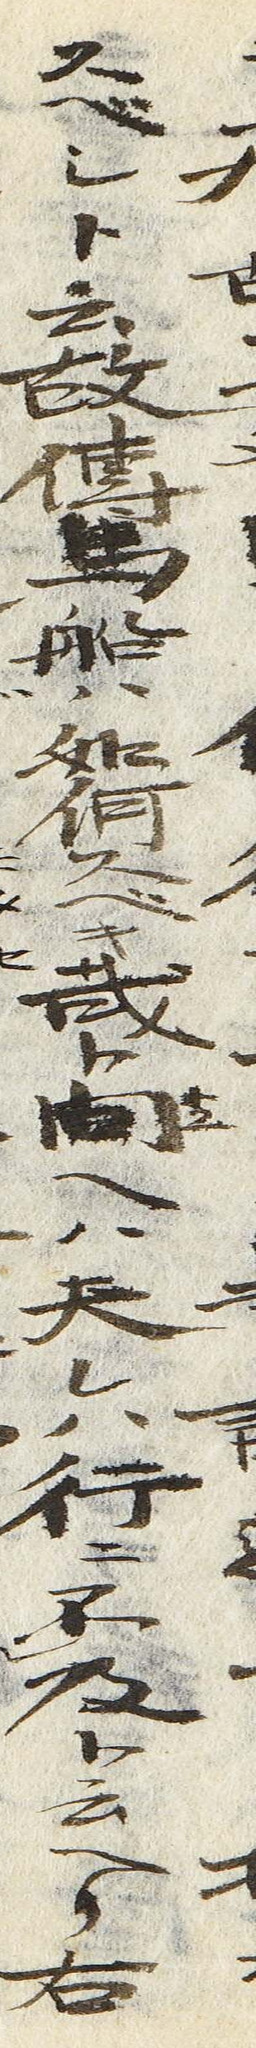スベシト云故伝馬船ハ如何スベキ哉ト問へハ夫レハ行ニ不及ト云ヘリ右
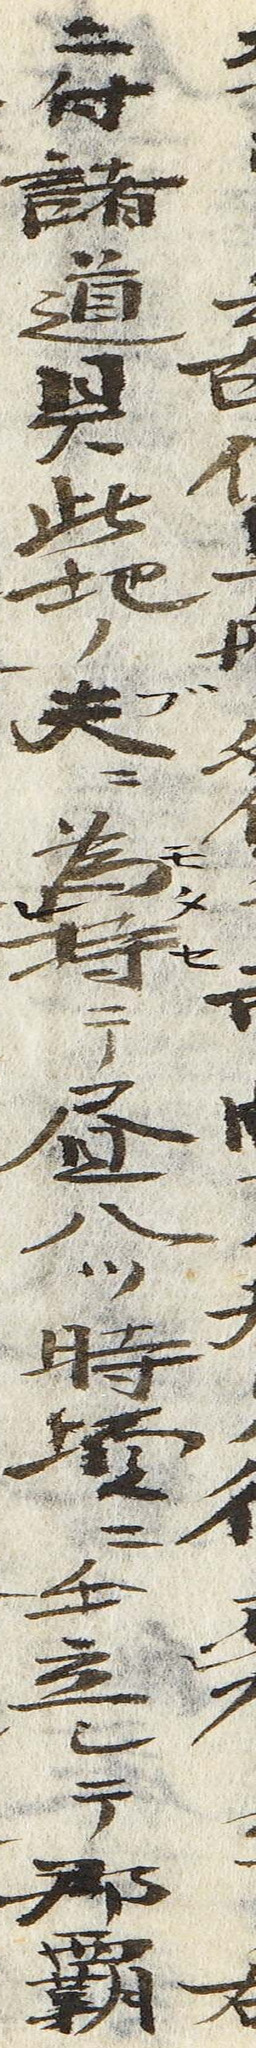ニ付諸道具此地ノ夫ニ為持テ昼八ツ時頃ニ出立シテ那覇
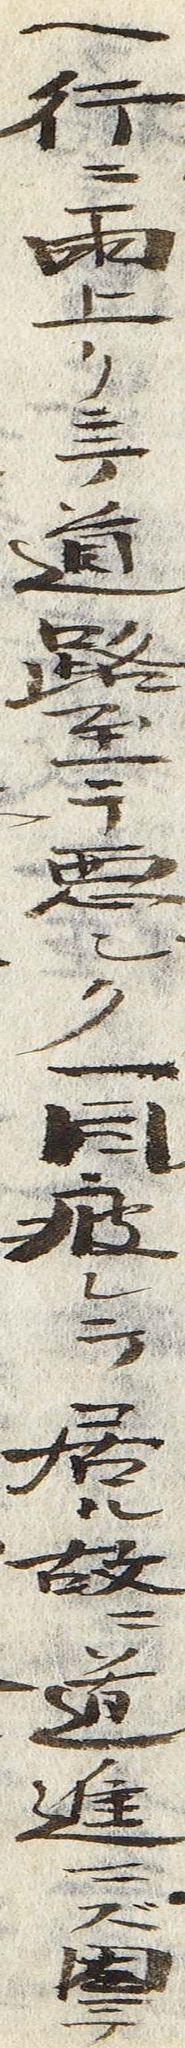ヘ行ニ雨上リニテ道路至テ悪シク一同疲レテ居ル故ニ道進ニズ困テ
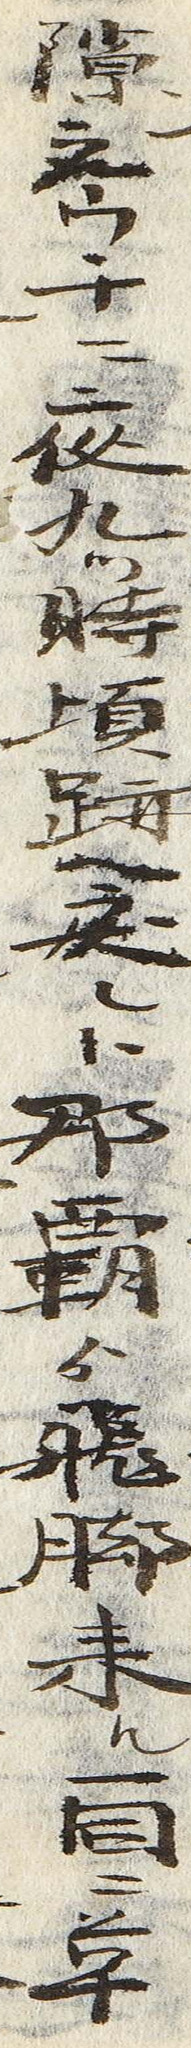隙之ウチニ夜九ツ時頃跡ヘ戻レト那覇ゟ飛脚来ル一同ニ草
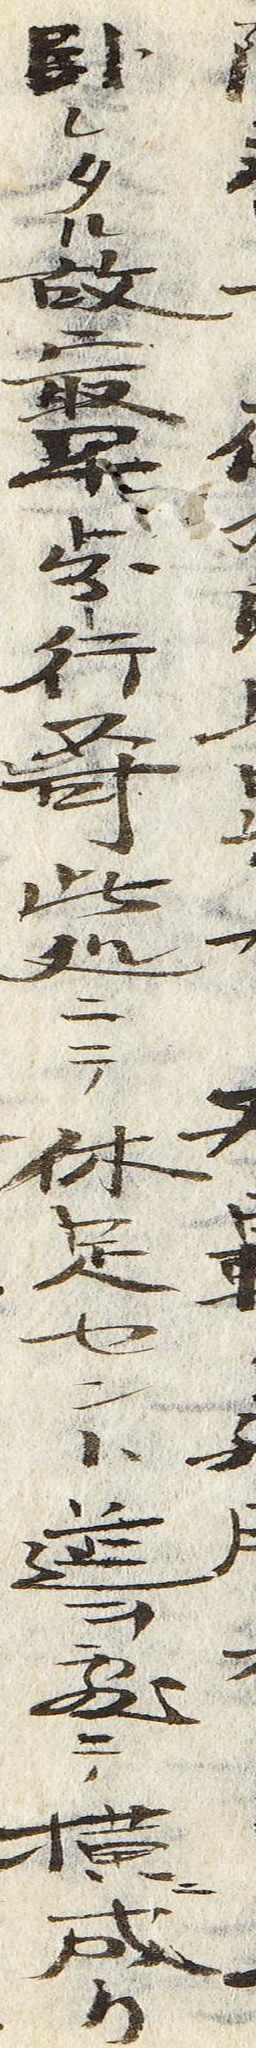臥レタル故最早歩行不可此処ニテ休足セントヲ處テ横ニ成リ
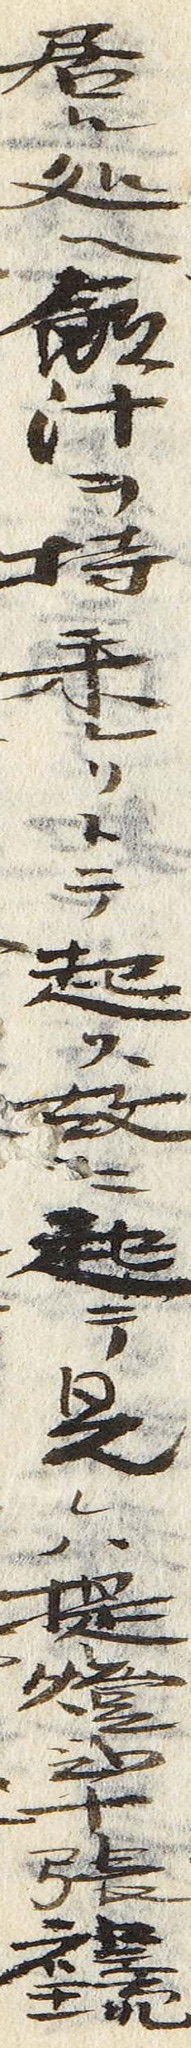処ヘ飯汁ヲ持来レリトテ起ス故ニ起テ見レハ提灯弐十張程琉
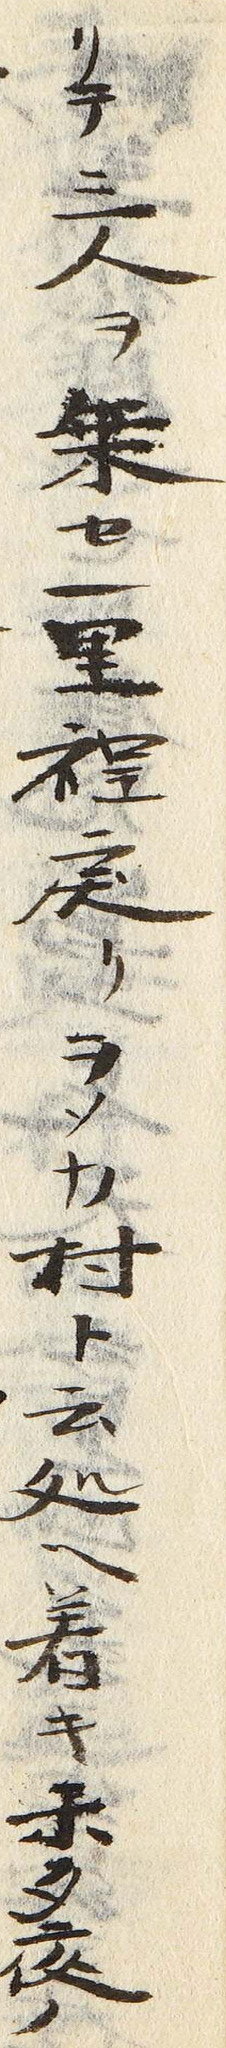リテ三人ヲ乗セ一里程戻りヲメカ村ト云処ヘ着キ未タ夜ノ
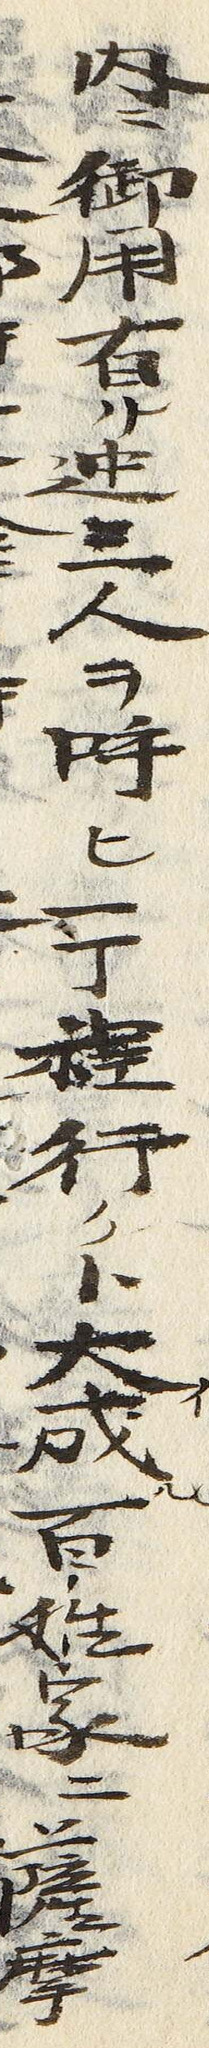内ニ御用有リ迚三人ヲ呼ヒ一丁程行クト大成百姓家ニ薩摩
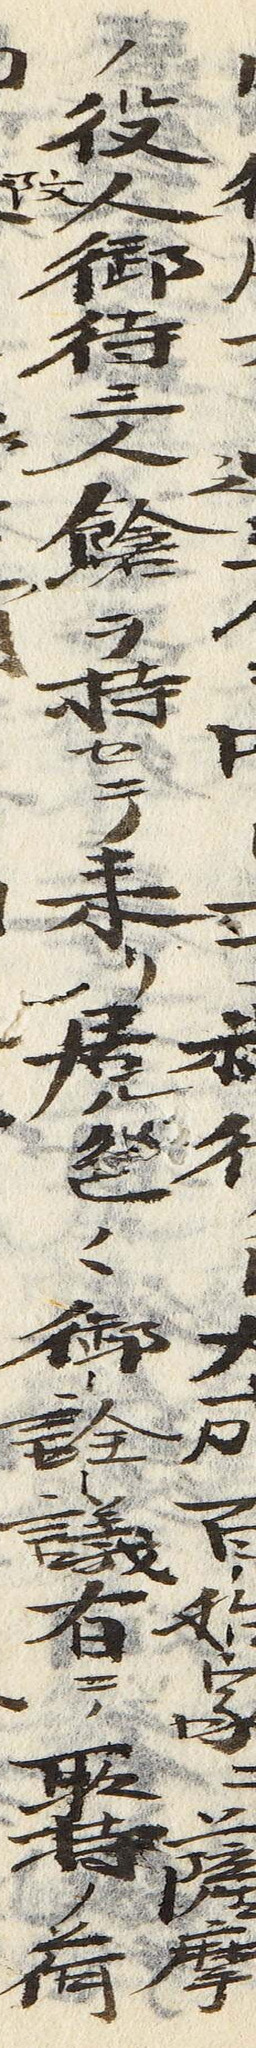ノ役人御侍三人ヲ持セテ来リ居ル色々御詮議有テ取持ノ荷
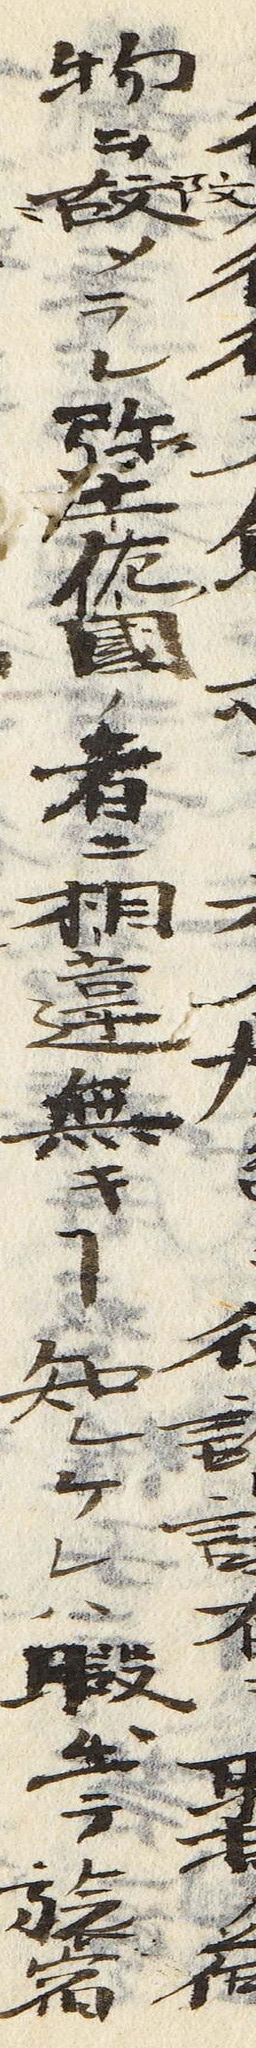物ヲメラレ弥土佐国ノ者ニ相違無キ事知レケレハ暇出テ旅宿
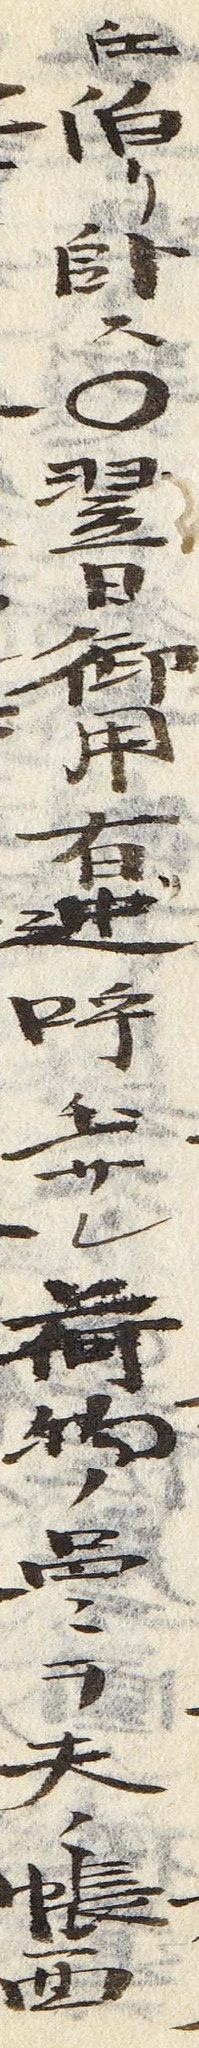え泊リス〇翌日御用有迚呼出サレ荷物ノ品々ヲ夫ノ帳面
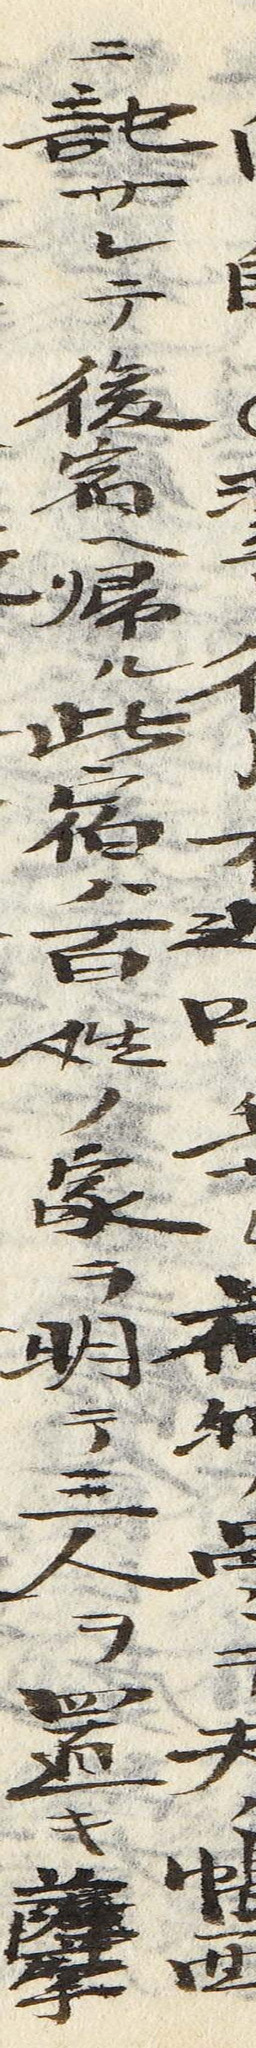ニ記サレテ後宿ヘ帰ル此宿ハ百姓ノ家ヲ明テ三人ヲ置キ薩摩
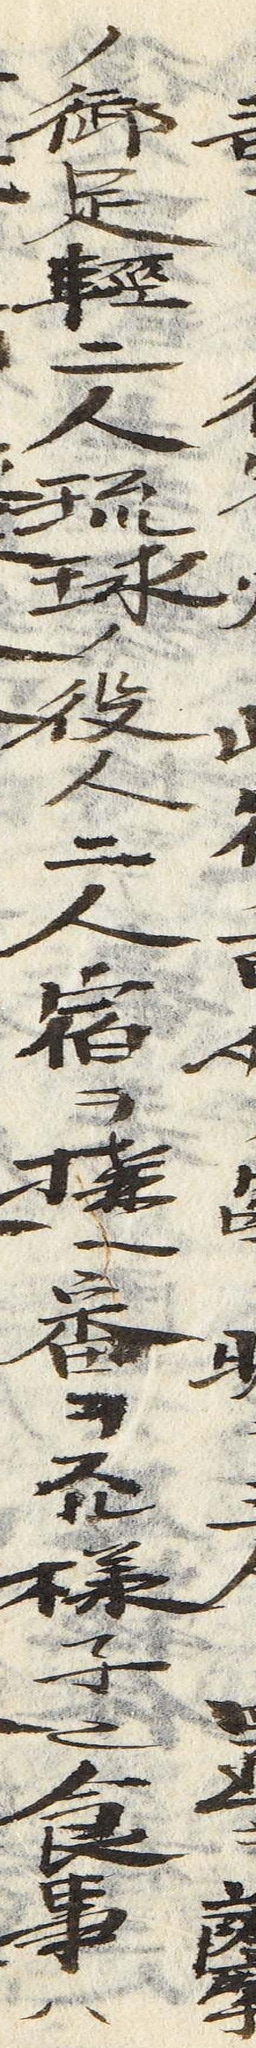ノ御足軽二人琉球ノ役人ノ二人宿ヲ構へ番ヲスル様子也食事ハ
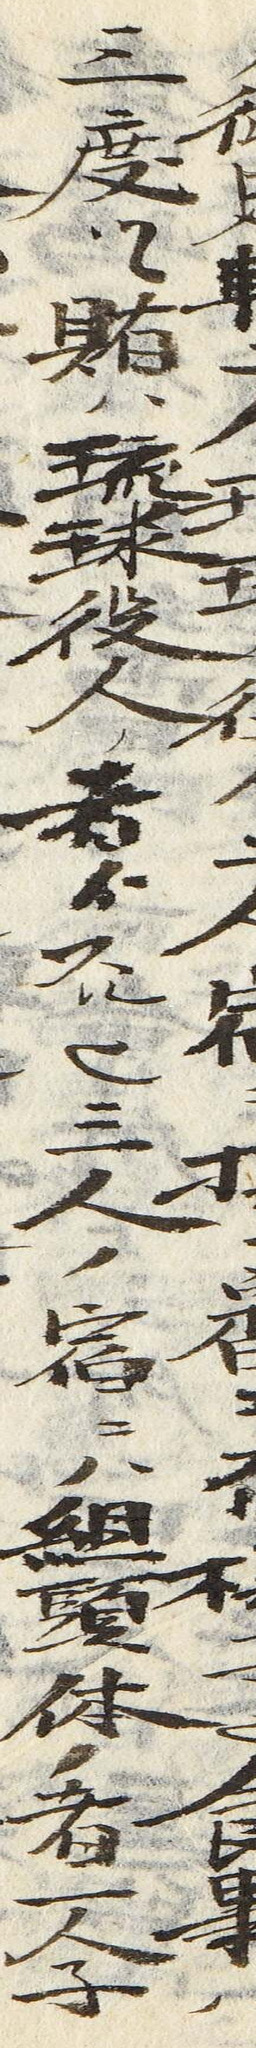三度ツヽ賄ハ琉球役人ノ者ゟスル也三人ノ宿ニハ組頭体ノ者一人子
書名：漂流記聞
